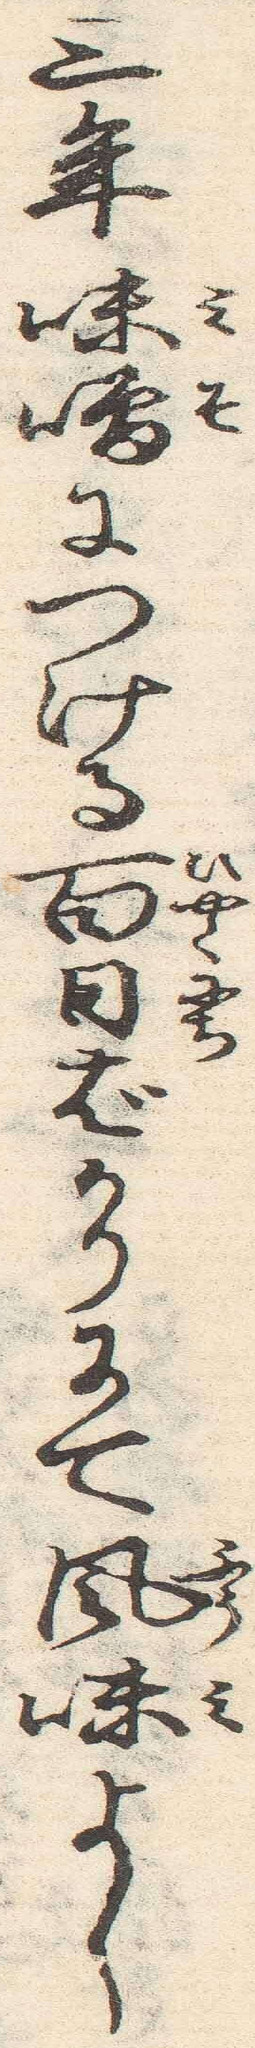三年味噌につける百日ばかりにて風味よし
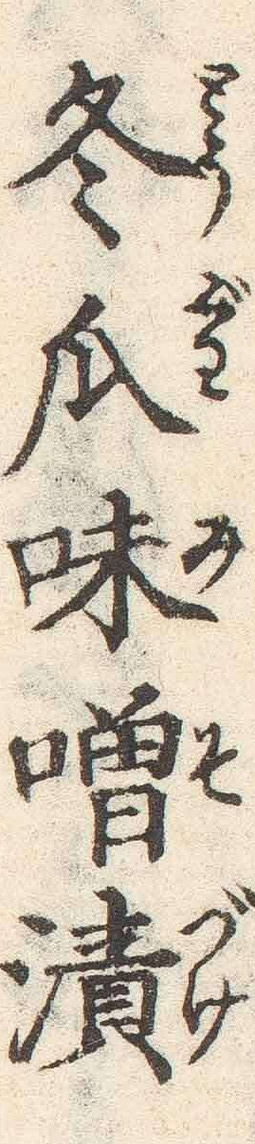冬瓜味噌漬
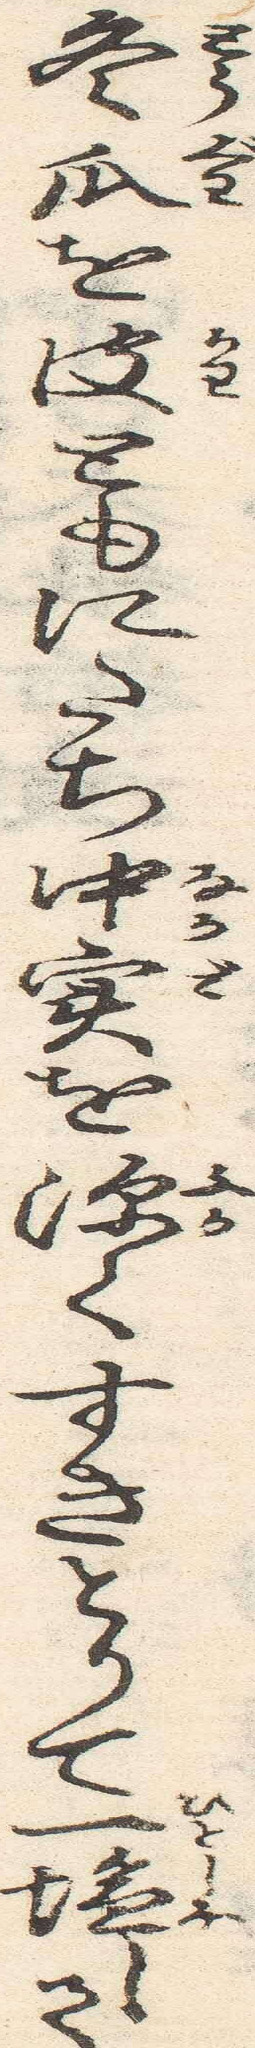冬瓜を皮ともにたち中実を深くすきとりて一塩して
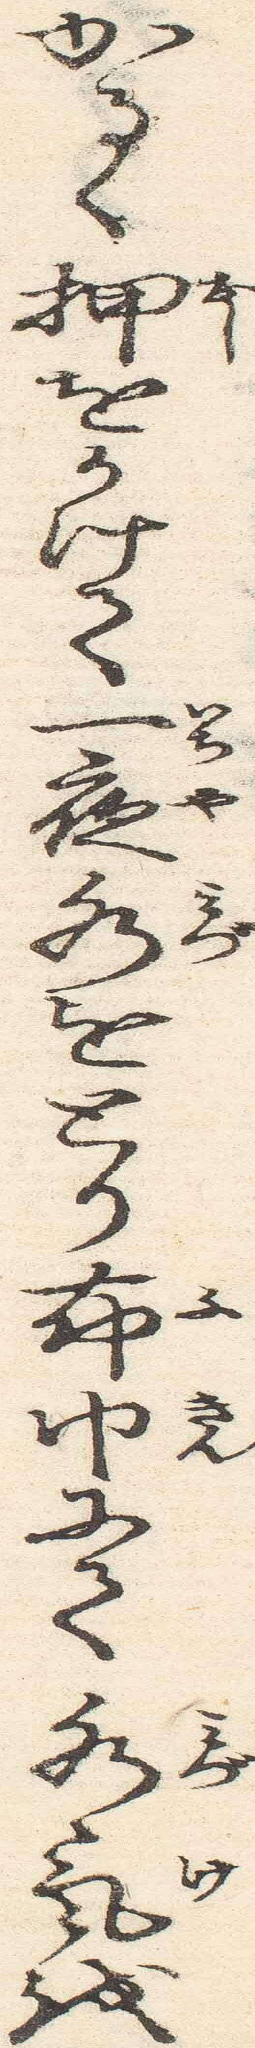なるく押をかけて一夜水をとり布巾にて水気を
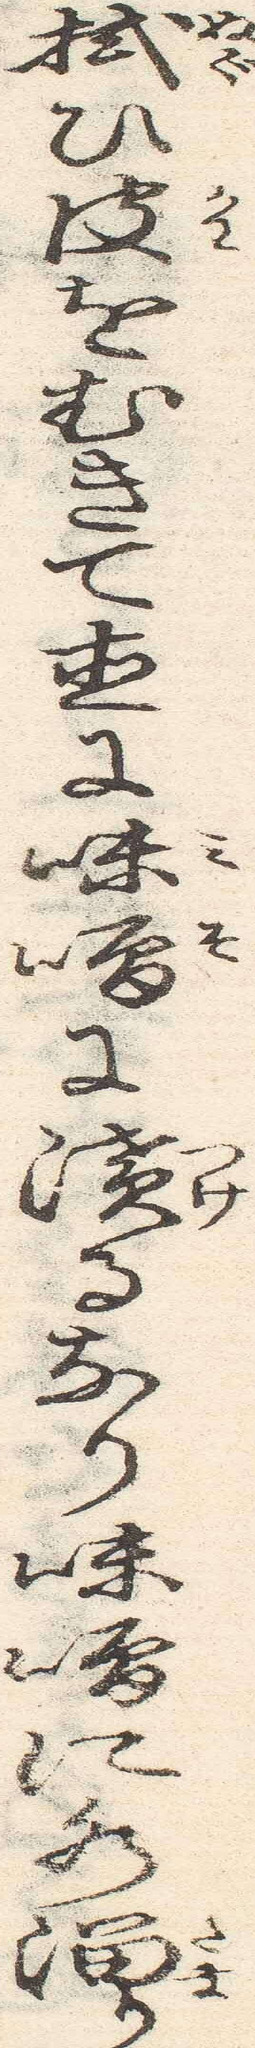拭ひ皮をむきて直に味噌に漬るなり味噌に水溜り
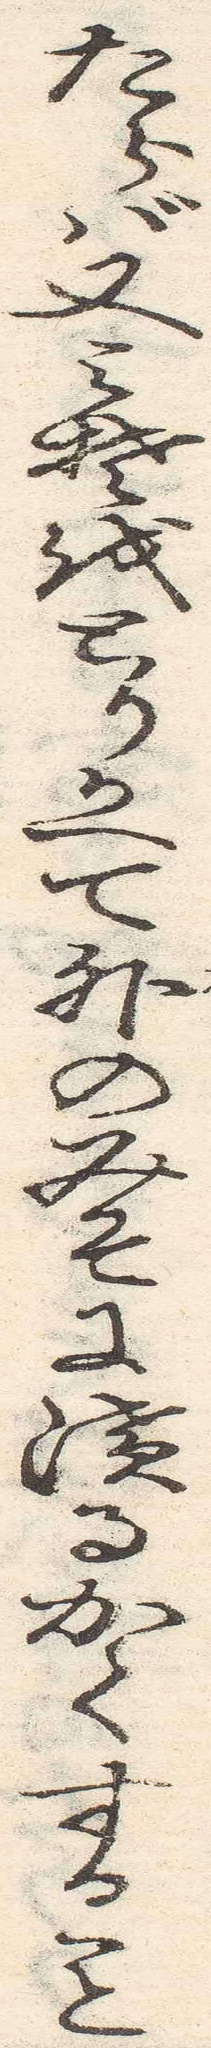たらば又みそをとりかへて外のみそに漬るかくすること
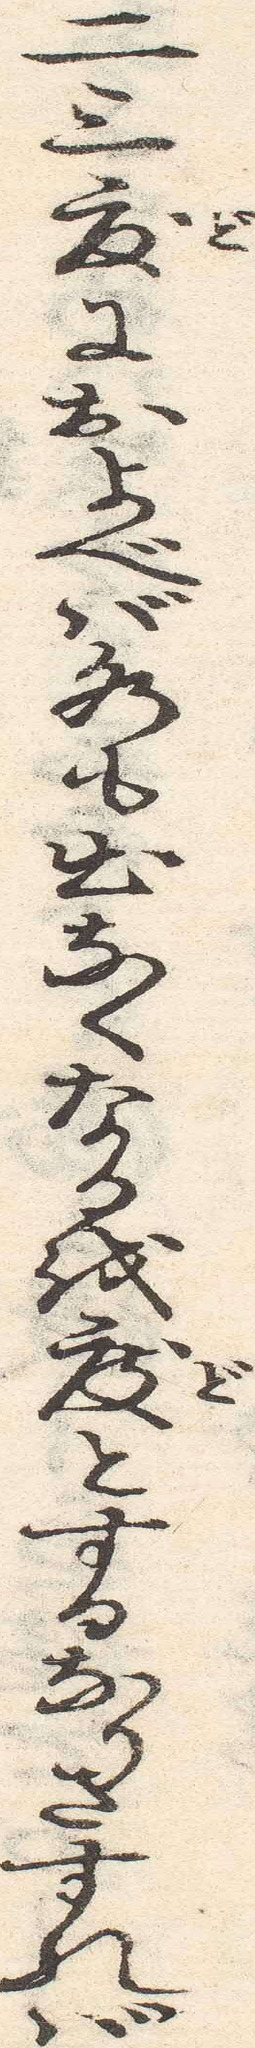二三度におよべば水も出なくなるを度とするなりさすれば
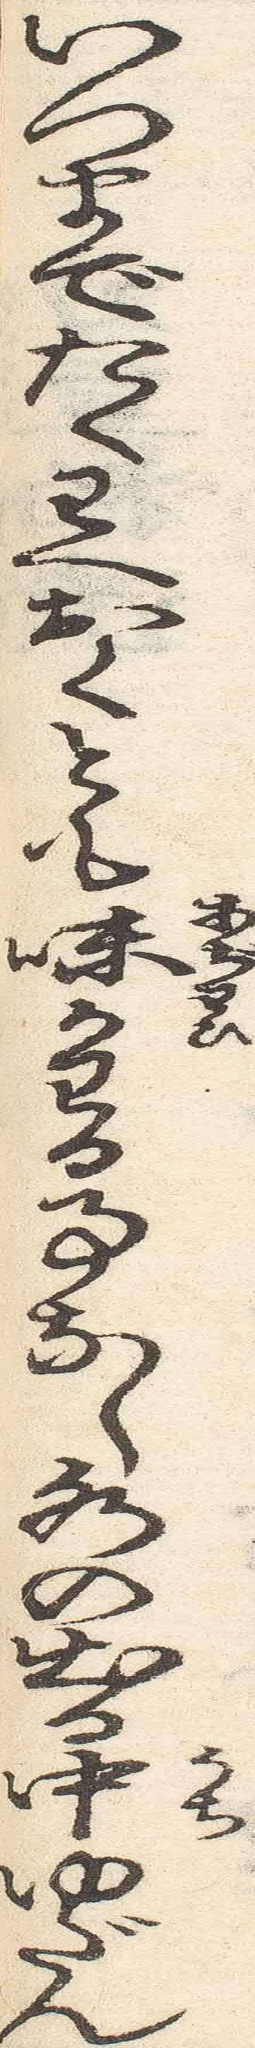いつまでたくわへおくとも味かわる事なしみ水の出る中ゆだん
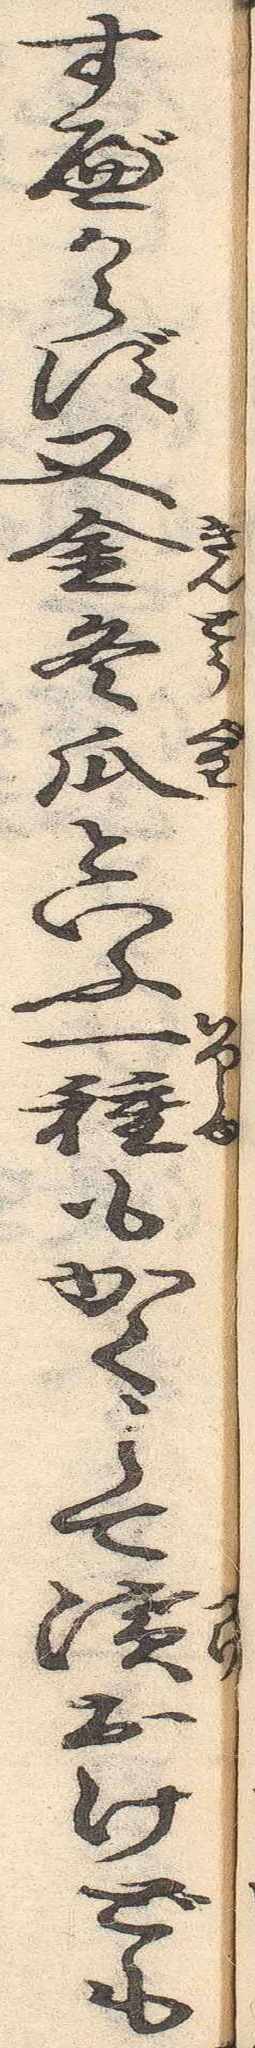すべからず又金冬瓜といふ一種もかくして漬おけども
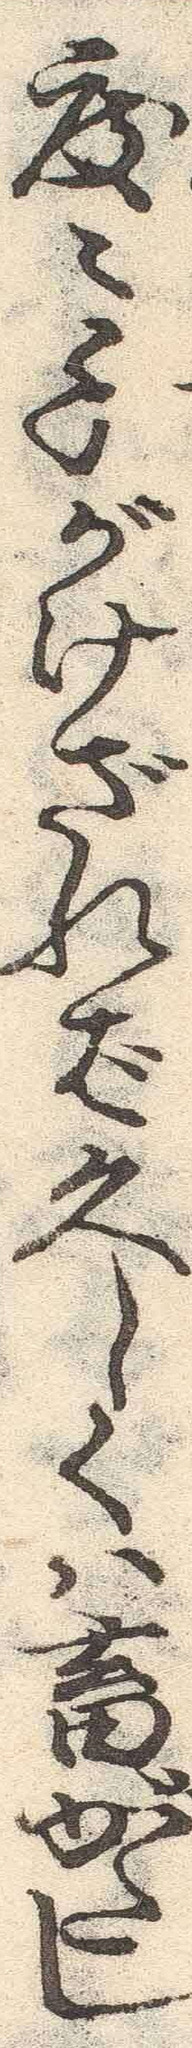度々手がけざれば久しくは蓄がたし
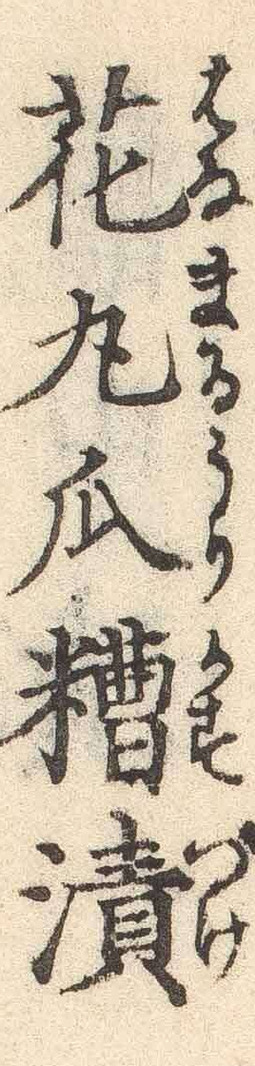花丸瓜粕漬
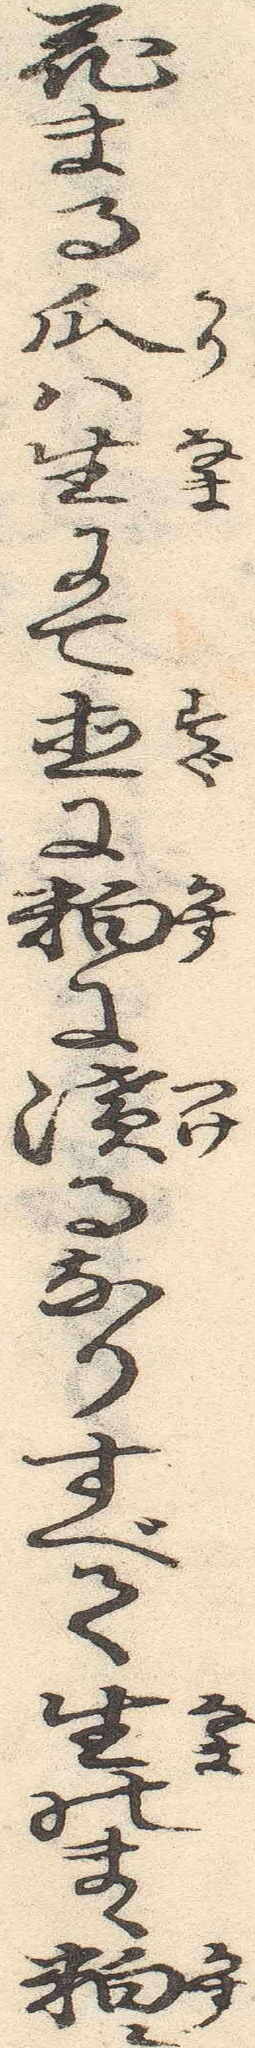花まる瓜は生にて直に粕に漬るなりすべて生のまゝ粕に
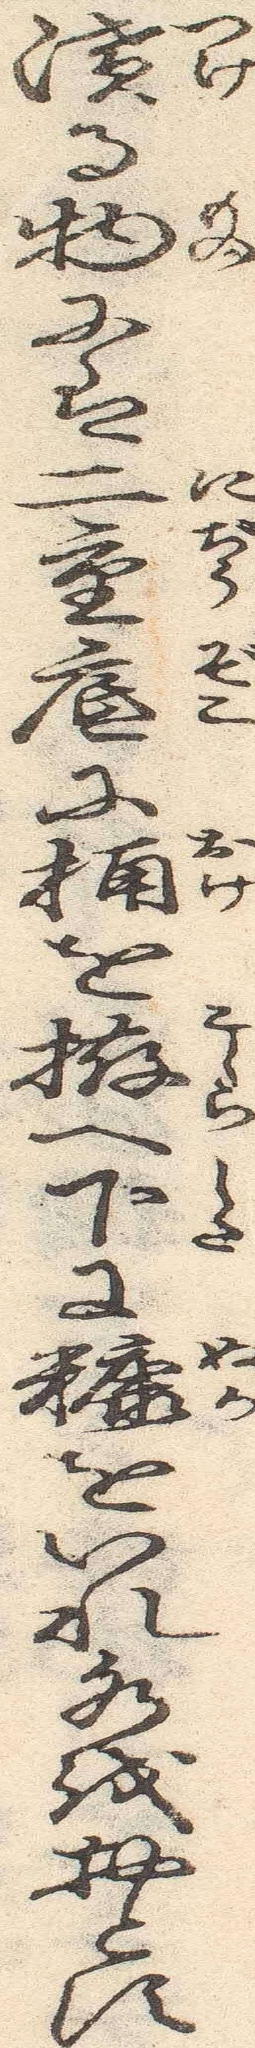漬る物には二重底に桶を拵へ下に糠をいれ水をおとす
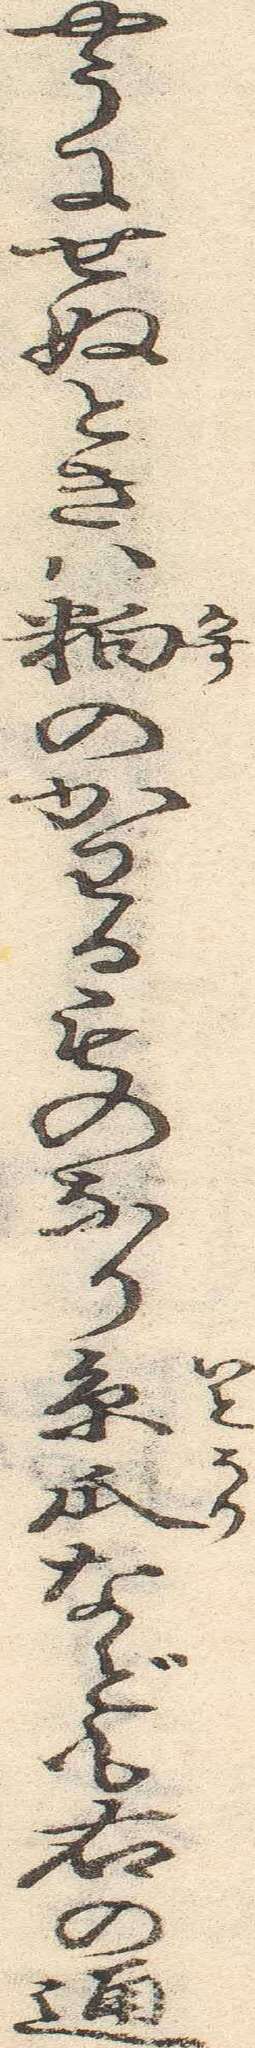やうにせぬときは粕のかわるものなり糸瓜なども右の通
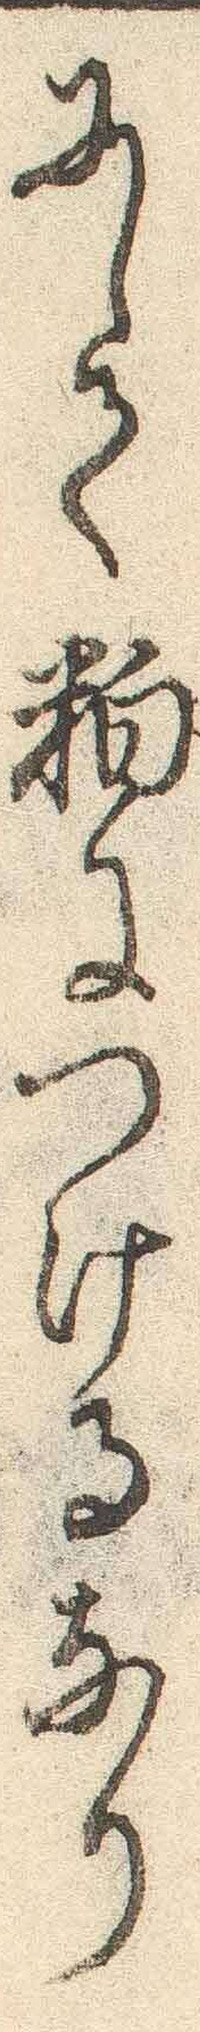にして粕につけるなり
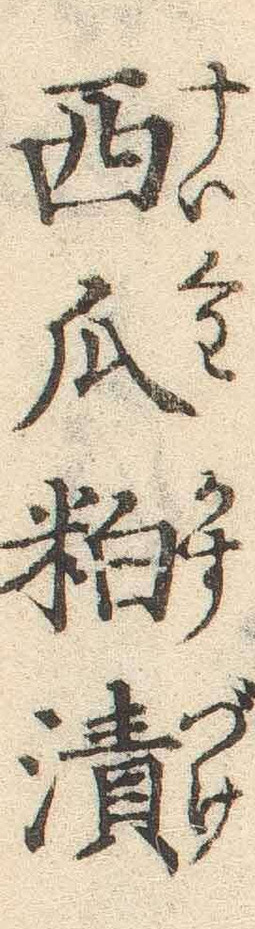西瓜粕漬
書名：四季漬物塩嘉言
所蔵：東京学芸大学附属図書館 国文学研究資料館
